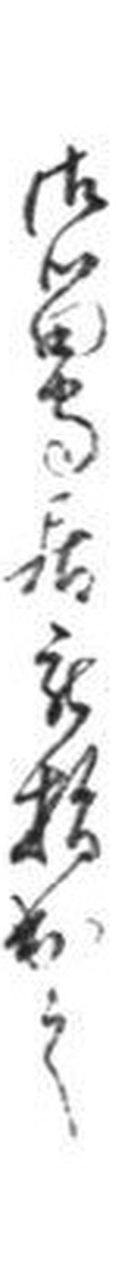御留守居被指出之
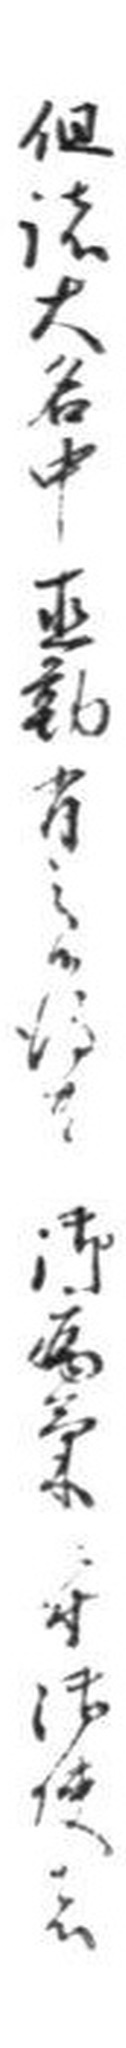但諸大名中直勤有之候得共御病気ニ付御使者
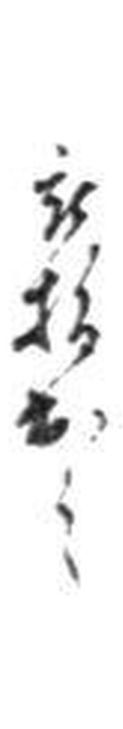被指出之
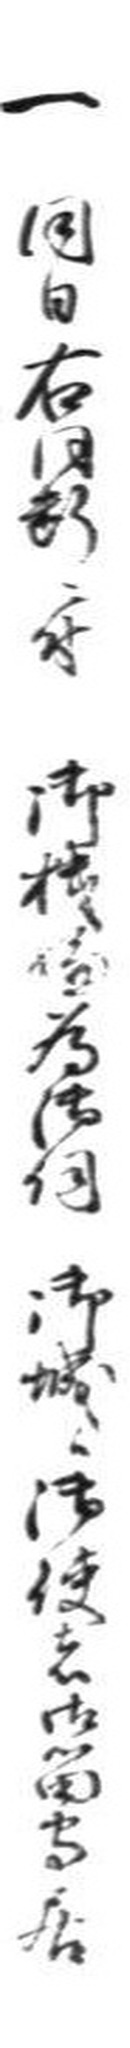一同日右同断ニ付御機嫌為御伺御城江御使者御留守居
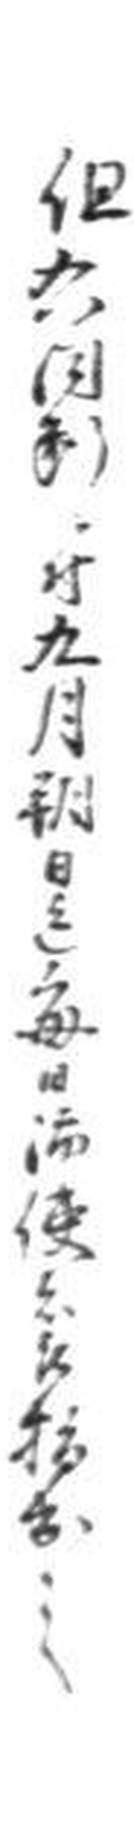但右同断ニ付九月朔日迄毎日御使者被指出之
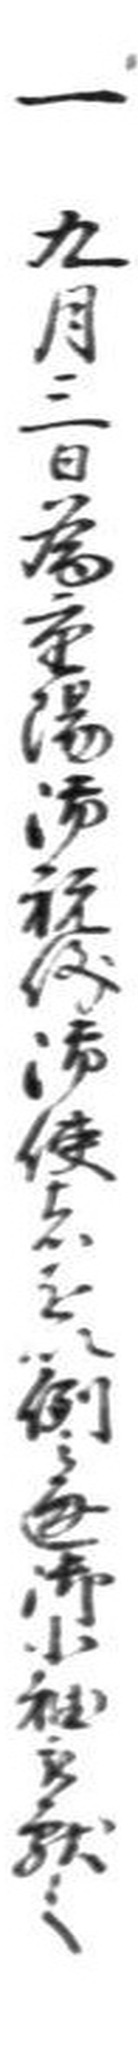一九月三日為重陽御祝儀御使者を以例之通御小袖被献之
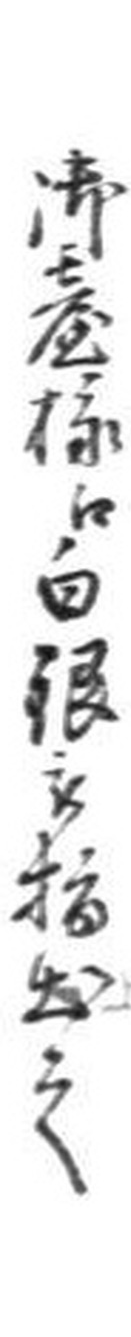御台様江白銀被指出之
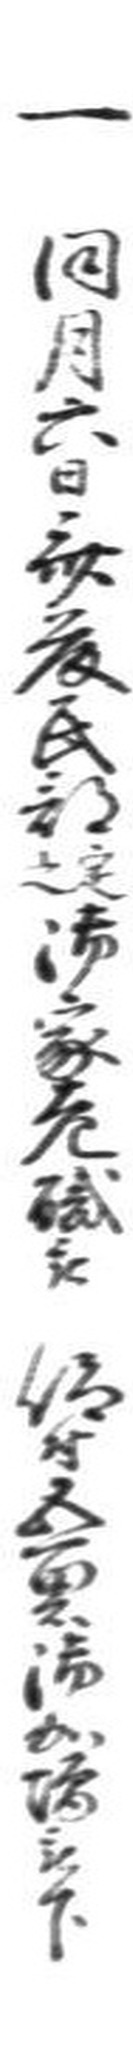一同月六日斎藤民部定之御家老職被仰付五百石御加増被下
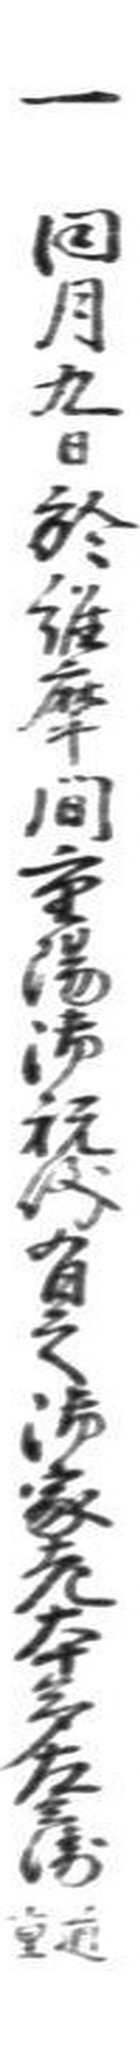一同月九日於維摩間重陽御祝儀有之御家老本多左兵衛道重
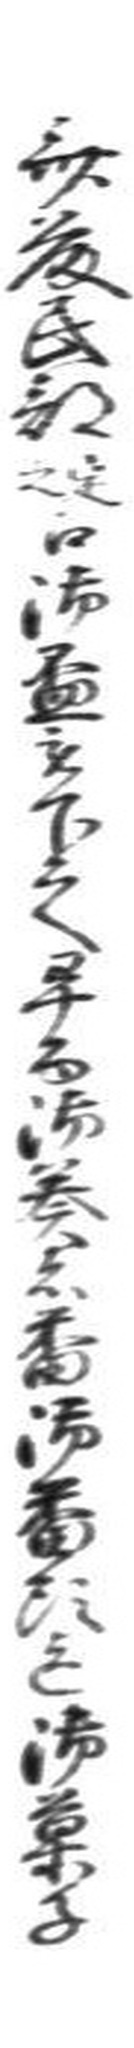斎藤民部定之江御盃被下之畢而御奏者番御番頭迄御菓子
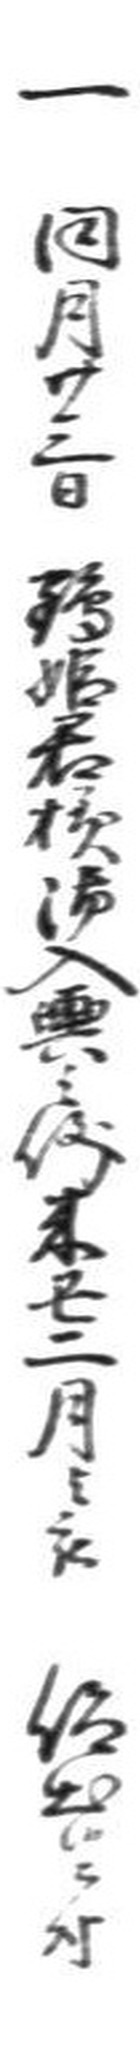一同月廿三日鶴姫君様御入輿之儀来丑二月と被仰出候ニ付

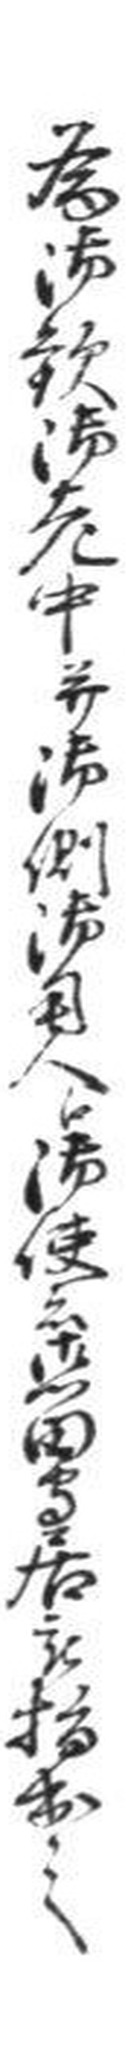為御歓御老中并御側御用人江御使者御留守居被指出之
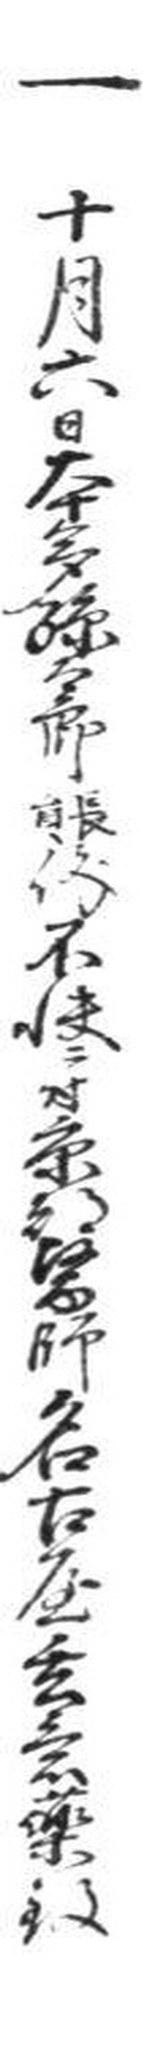一十月六日本多孫太郎長員儀不快ニ付京都医師名古屋玄意薬致
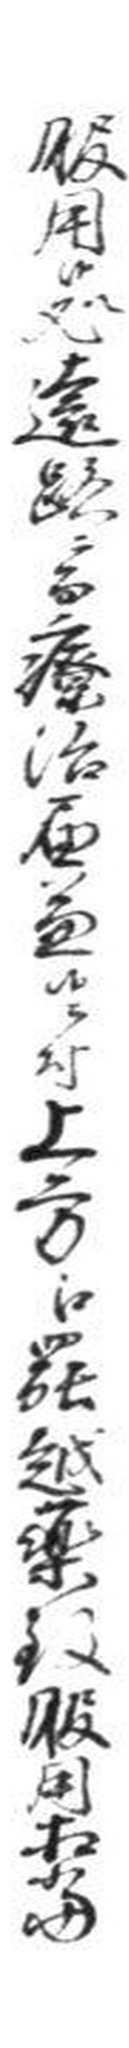服用候処遠路ニ而療治届兼候ニ付上方江罷越薬致服用相留
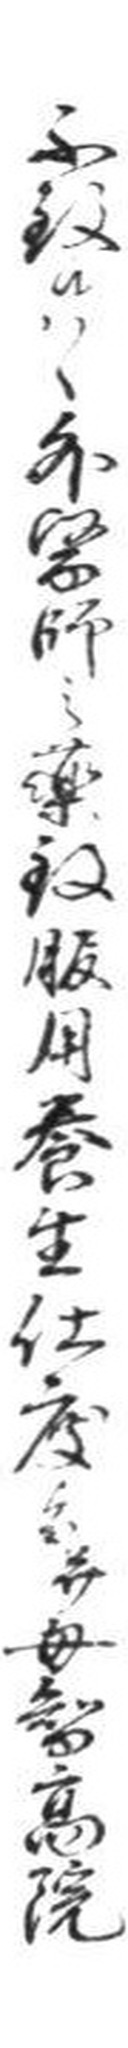不致候ハヽ外医師之薬致服用養生仕度旨并母智高院
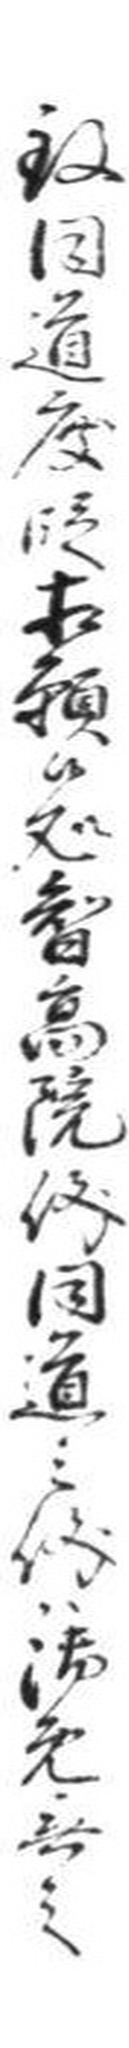致同道度段相願候処智高院儀同道之儀ハ御免無之
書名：家譜 十五 綱昌公 従天和元年到元禄十二年
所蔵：福井県文書館 Fukui Prefectural Archives
